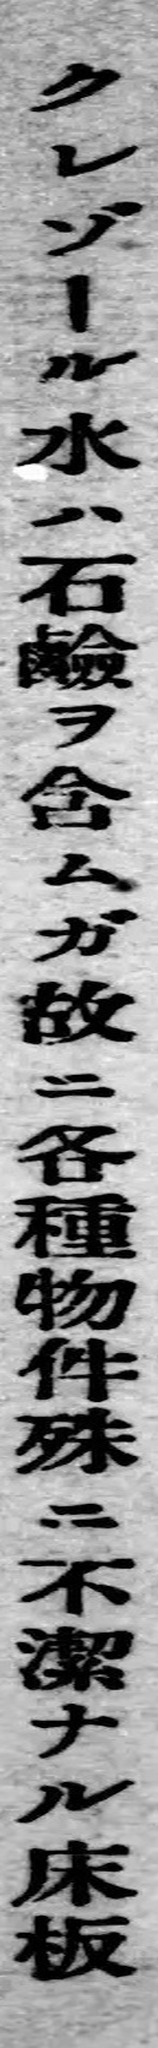クレゾール水ハ石鹼ヲ含ムガ故ニ各種物件殊ニ不潔ナル床板
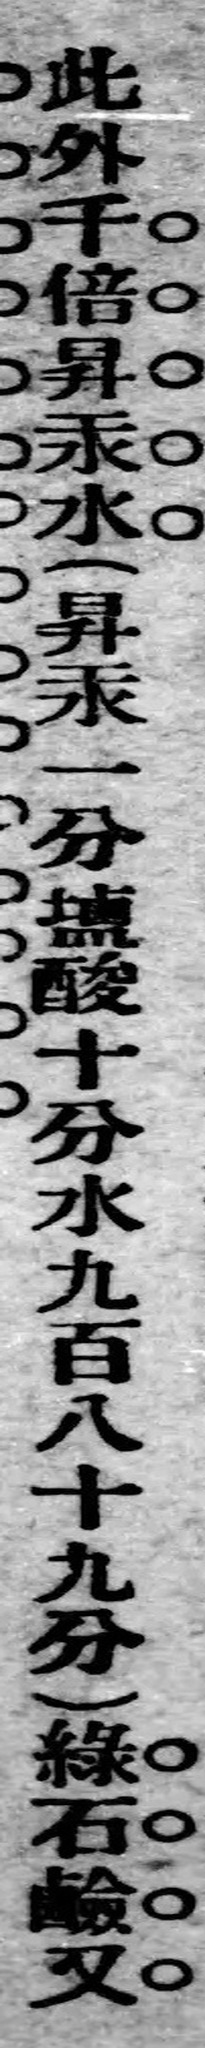此外千倍昇汞水(昇汞一分䀋酸十分水九百八十九分)綠石鹼又
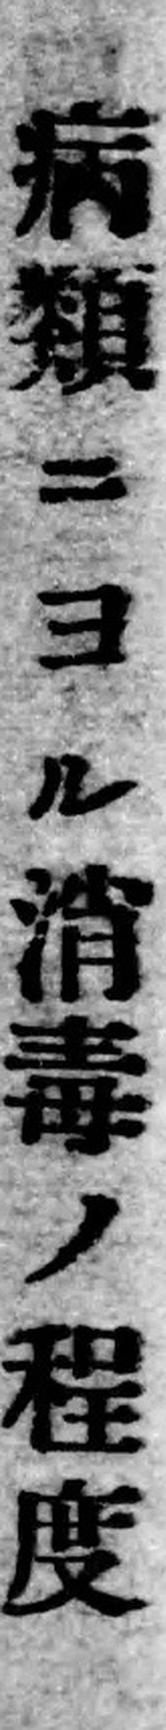病類ニヨル消毒ノ程度
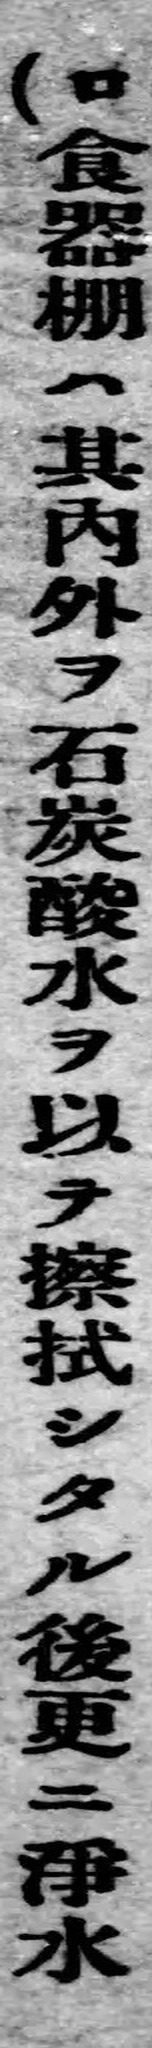(ロ)食器棚ハ其内外ヲ石炭酸水ヲ以テ擦拭シタル後更ニ淨水
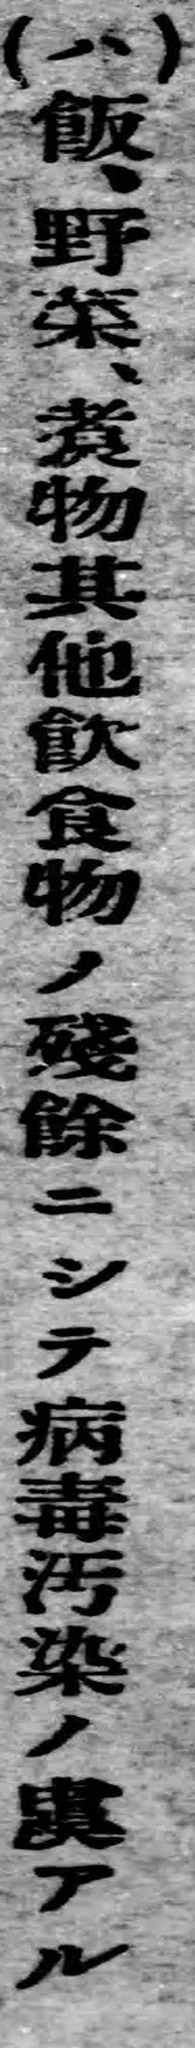(ハ)飯、野菜、煑物其タ飮食物ノ殘餘ニシテ病毒汚染ノ虞アル

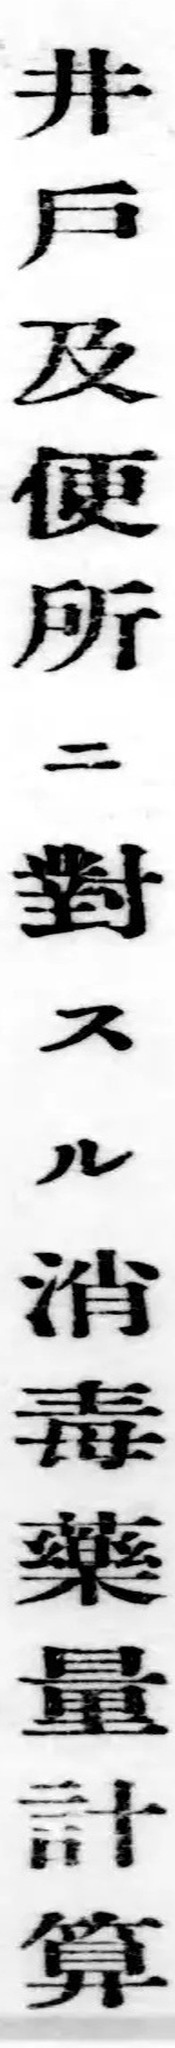│井戸及便所ニ対スル消毒薬量計算
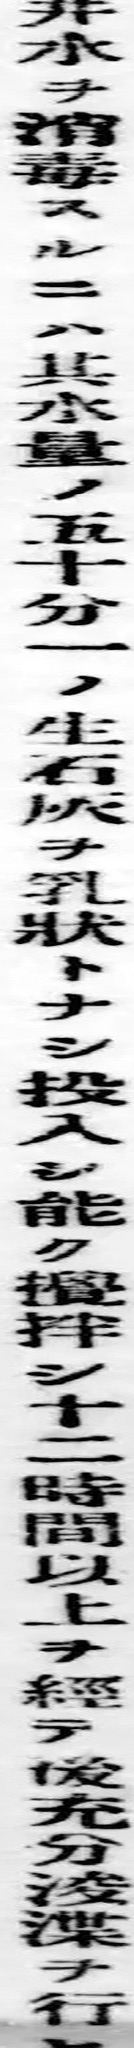井水ヲ消毒スルニハ其水量ノ五十分ノ一ノ生石灰ヲ乳状トナシ投入シ能ク攪拌シ十二時間以上ヲ経テ後充分浚渫ヲ行
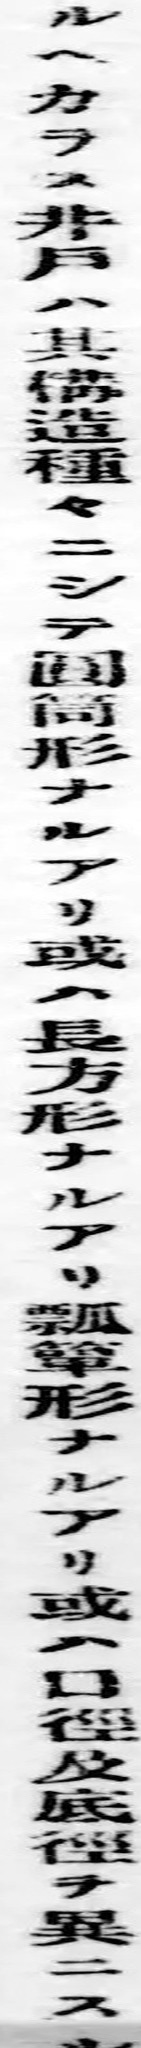サルハカラズ井戸ハ其構造種々ニシテ円筒形ナルアリ或ハ長方形ナルアリ瓢箪形ナルアリ或ハ口径及底径ヲ異ニスル
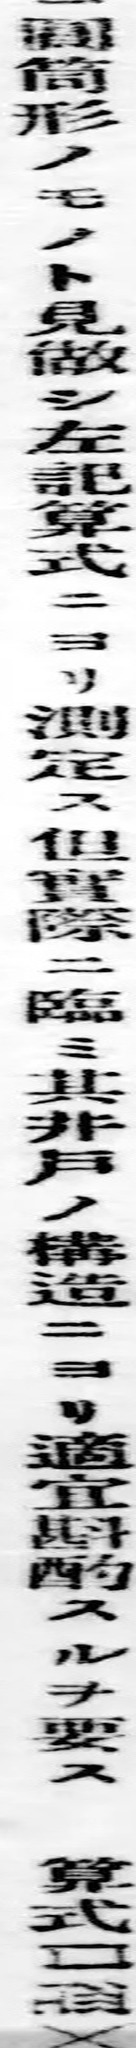ニ円筒形ノモノトン見做シ左記算式ニヨリ測定ス但実際ニ臨ミ其井戸ノ構造ニヨリ適宜斟酌スルヲ要ス算式口径×
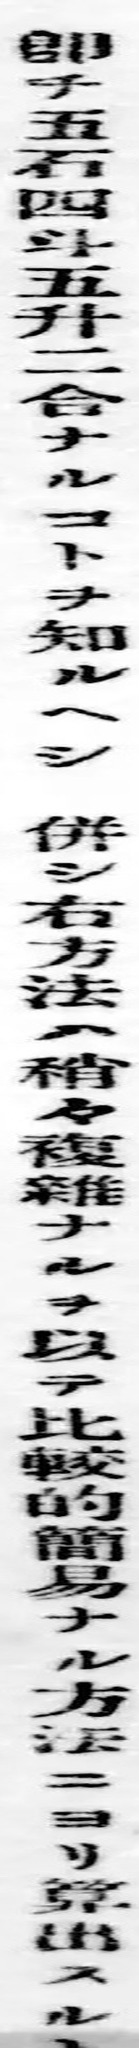即チ五石四斗五升二合ナルコトヲ知ルヘシ併シ右方法ハ稍々複雑ナルヲ以テ比較的簡易ナル方法ニヨリ算出スルト
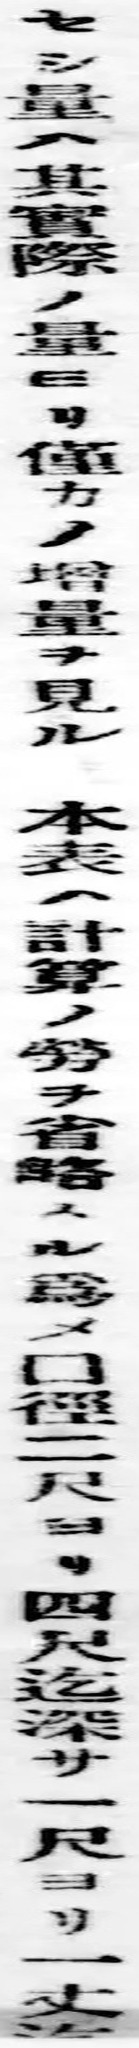セシ量ハ其実際ノ量ヨリ僅カノ増量ヲ見ル本評ハ計算ノ労ヲ省略スル為メ口径二尺ヨリ四尺迄深サ一尺ヨリ一丈ン迄
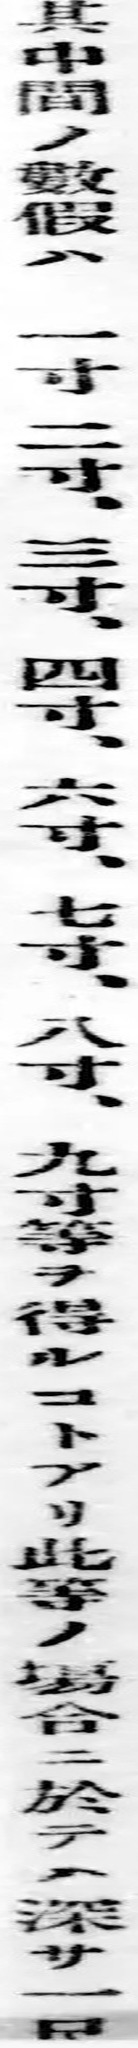其中間ノ数假ハ一寸二寸、三寸、四寸、六寸、七寸、八寸、九寸等ヲ得ルコトアリ此等ノ場合ニ於テハ深サ一尺
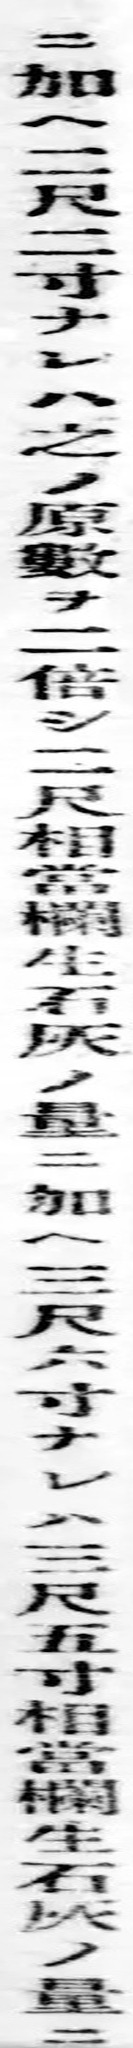ニ加ヘ二尺二寸ナレハ之ノ原数ヲ二倍シ二尺相当欄生石灰ノ量ニ加ヘ三尺六寸ナレハ三尺五寸相当欄生石灰ノ量ニ
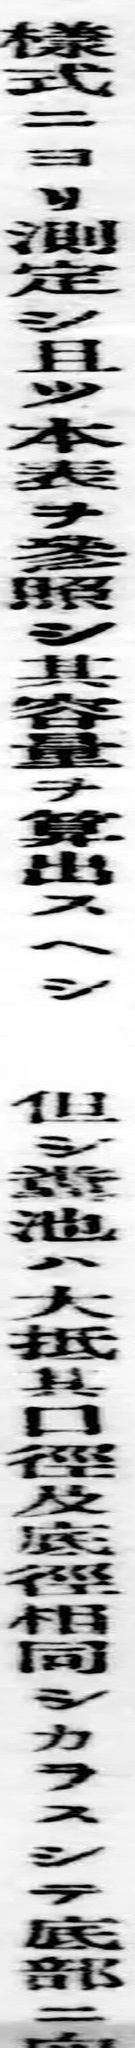様式ニヨリ測定シ且ツ本表ヲ参照シ其容量ヲ算出スヘシ但シ糞池ハ大抵其口径及底径相同シカラスシテ底部ニ
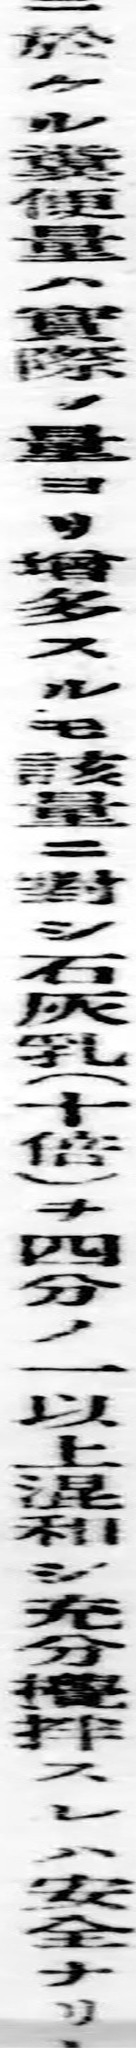ニ於ケル糞便量ハ実際ノ量ヨリ増多スルモ該量ニ対シ石灰乳(十倍)ヲ四分ノ一以上混和シ充分攪拌スレハ安全ナリ

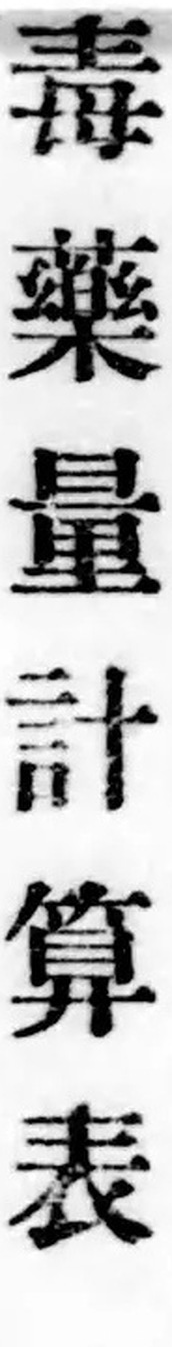│毒薬量計算表
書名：袖珍防疫必携
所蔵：国立国会図書館 National Diet Library, JAPAN
